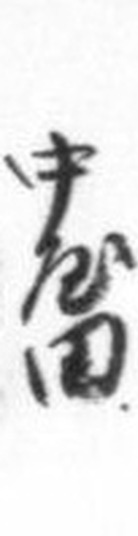中屋田
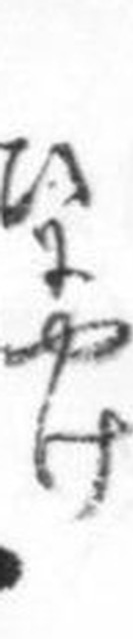ひにやけ
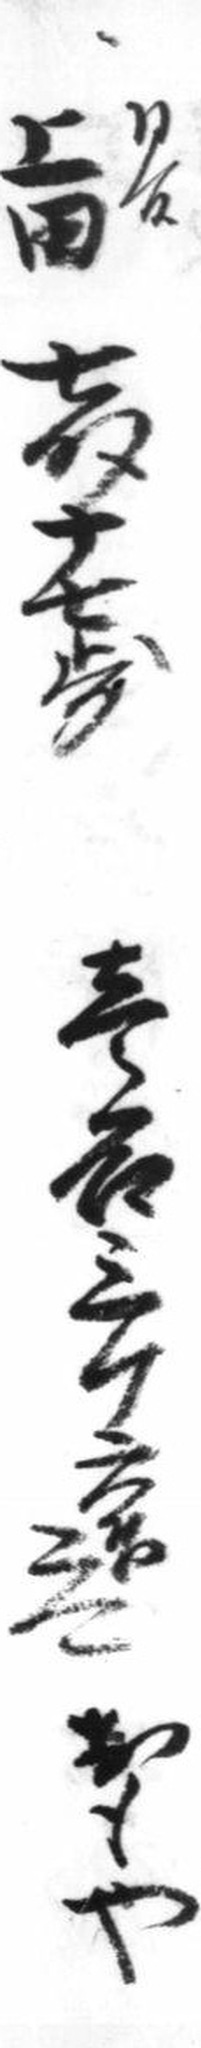上田七畝十七歩壱石三斗六升二合出〆屋
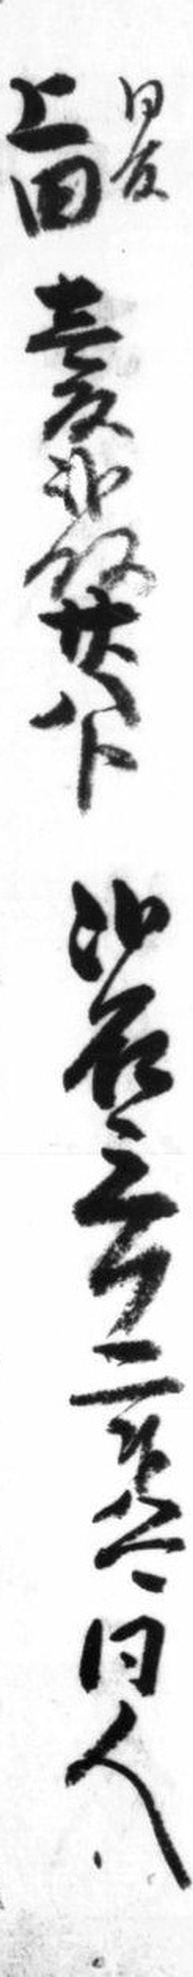上田壱反弐畝廿八歩弐石三斗二升八合同人
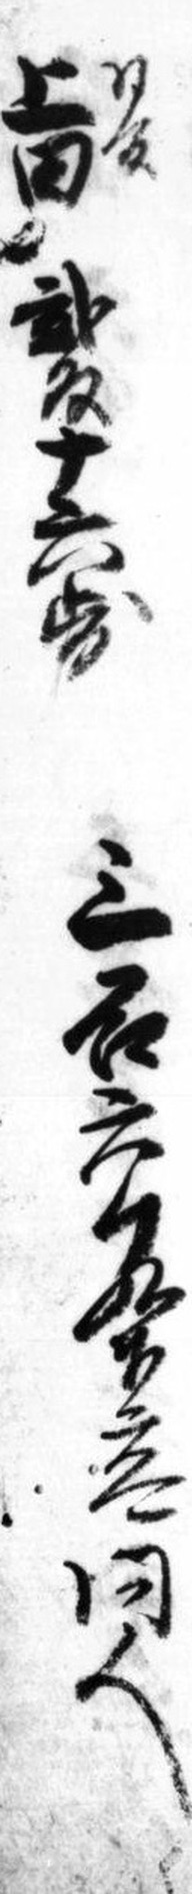上田弐反十六歩三石六斗九升弐二合同人

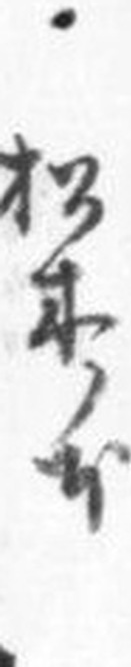松木ノ本
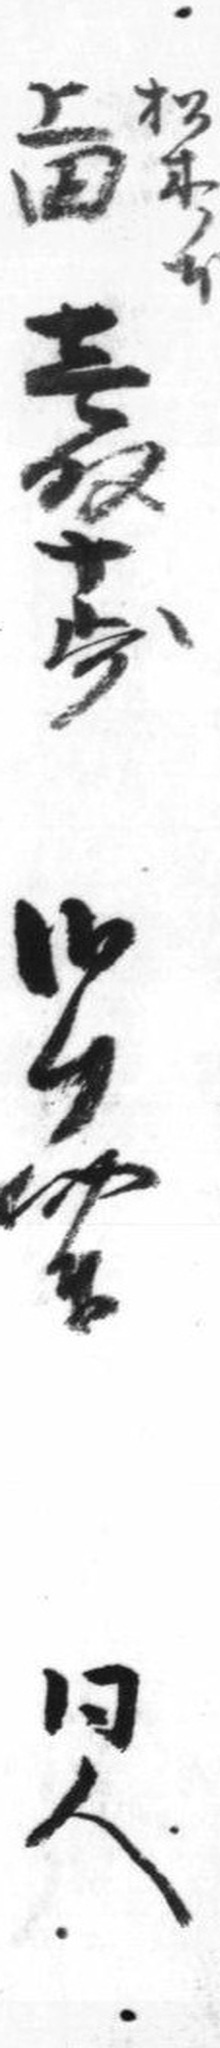上田壱畝十歩弐斗四升同人
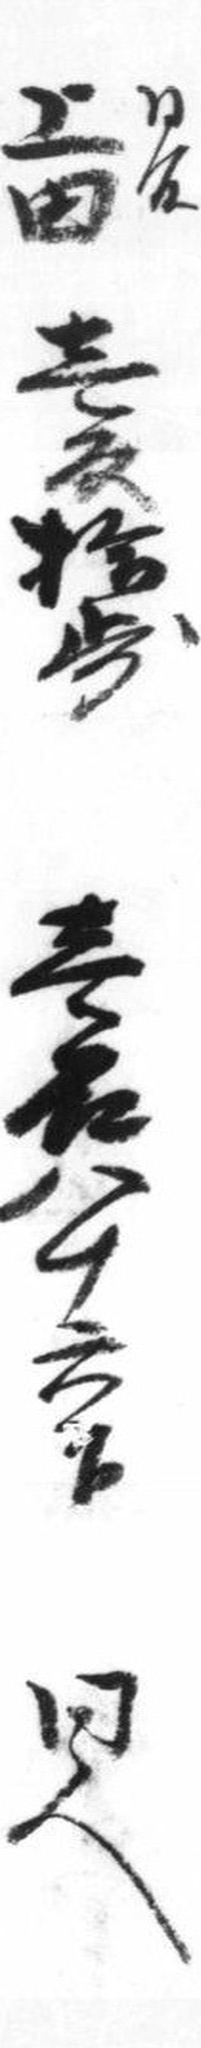上田壱反拾歩壱石八斗六升同人
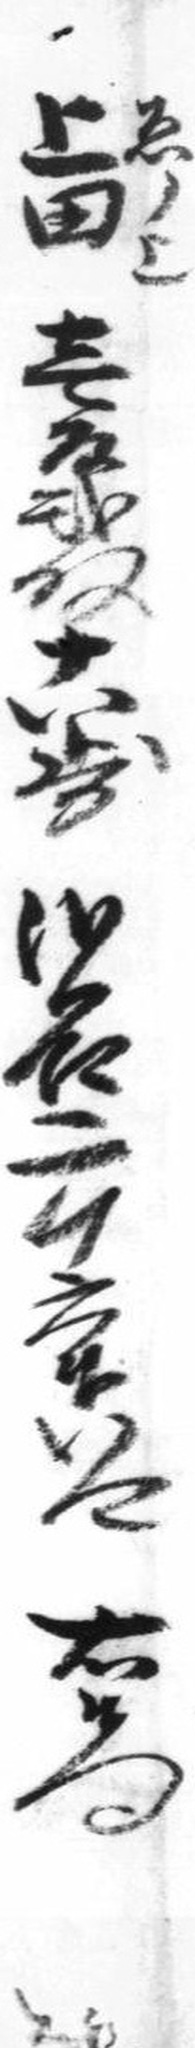上田壱反弐畝十八歩弐石二斗六升八合右衛門
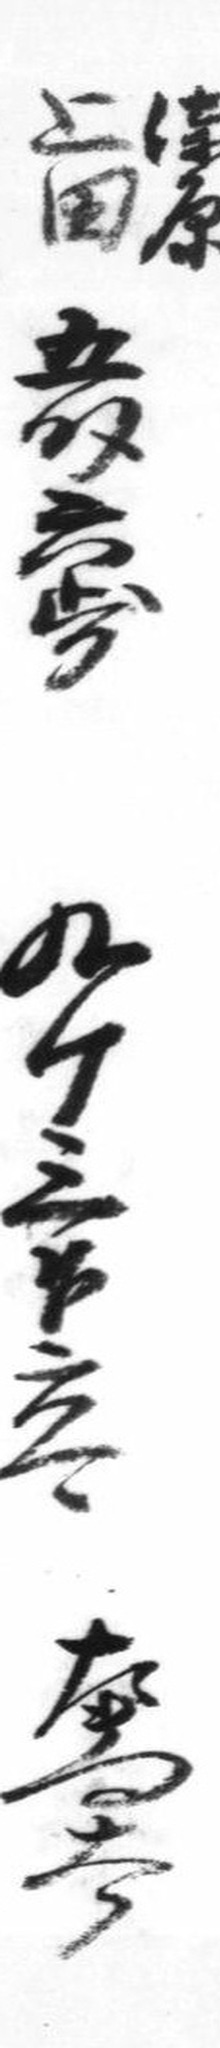上田五畝六歩九斗三升六合左衛門太郎
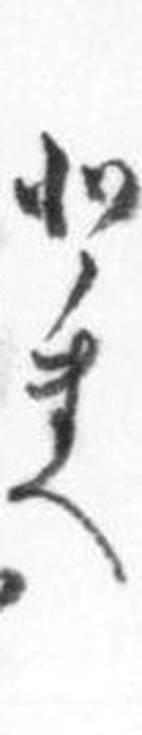北ノまへ
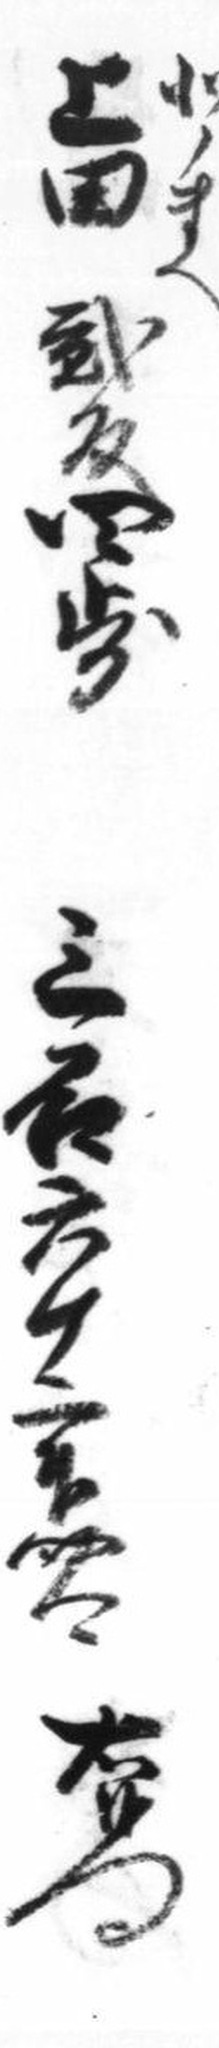上田弐畝四歩三石六斗二升四合右衛門
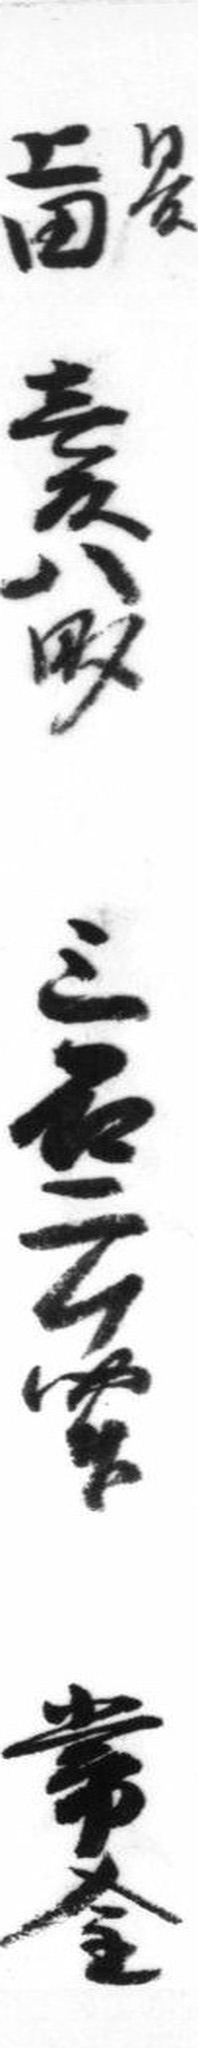上田壱反八畝三石二斗四升常念
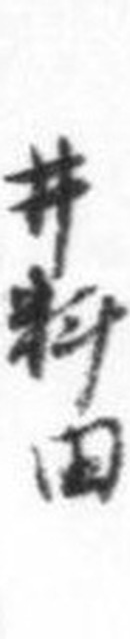井料田
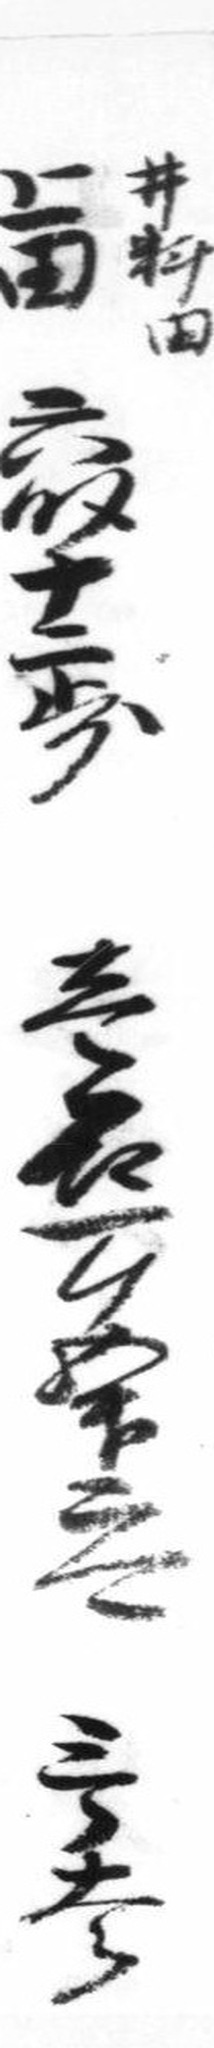上田六畝十二歩壱石一斗五升二合三郎太郎
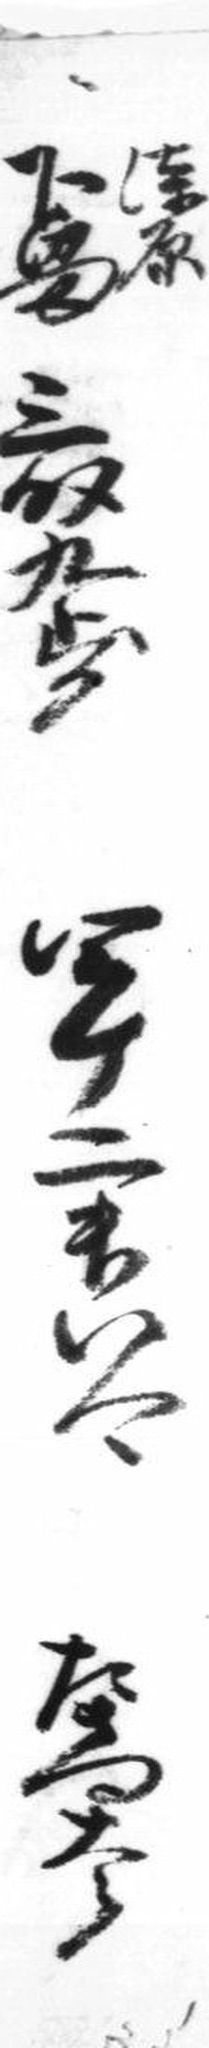下畠三畝九歩四斗二升八合左衛門太郎
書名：越前国大野郡今井村御検地帳
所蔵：福井県文書館 Fukui Prefectural Archives
